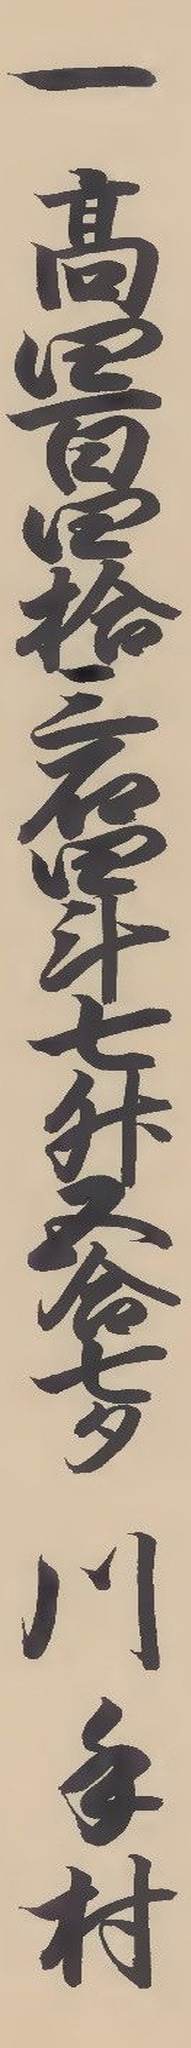一高四百四拾三石四斗七升五合七勺川手村
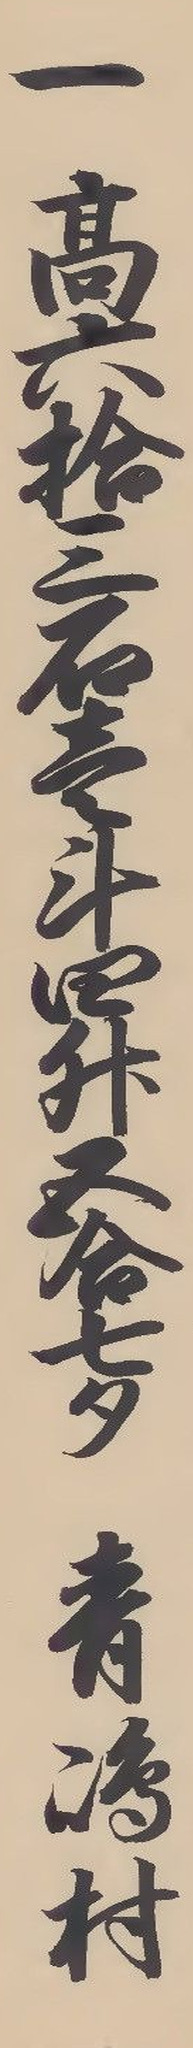一高六拾三石壱斗四升五合七勺青島村

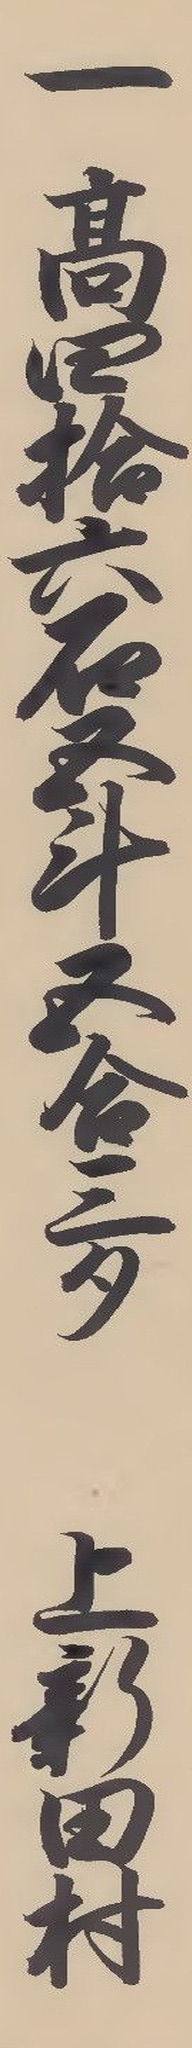一高四拾六石五斗五合三勺上新田村
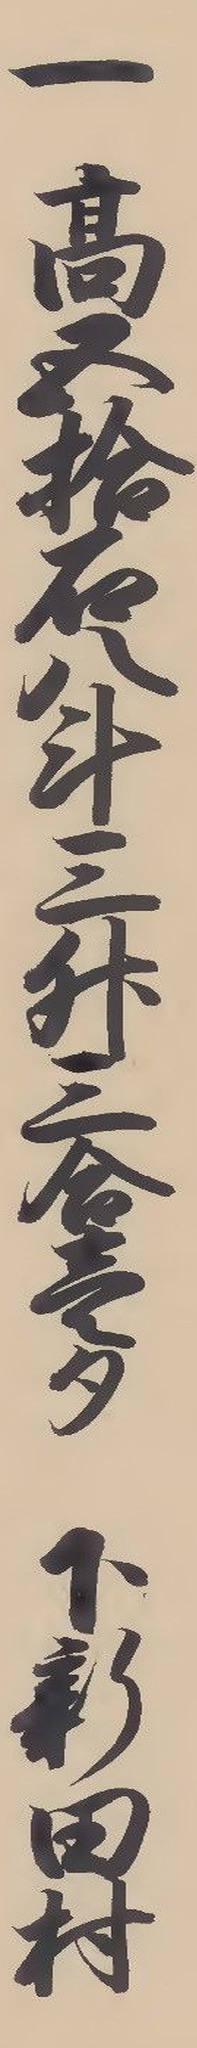一高五拾石八斗三升三合壱勺下新田村
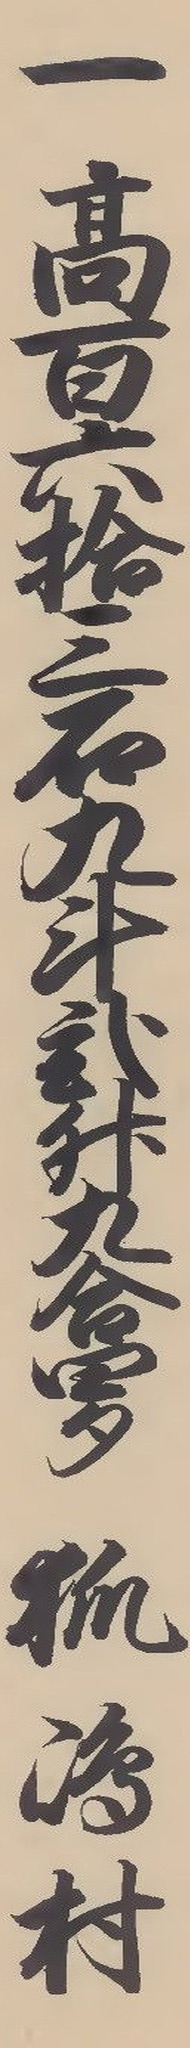一高百六拾三石九斗弐升九合四勺狐島村
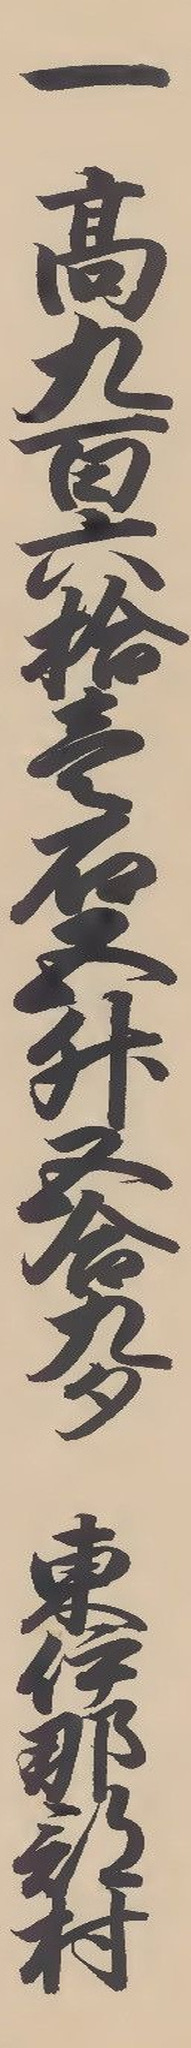一高九百六拾壱石五升五合九勺東伊那部村
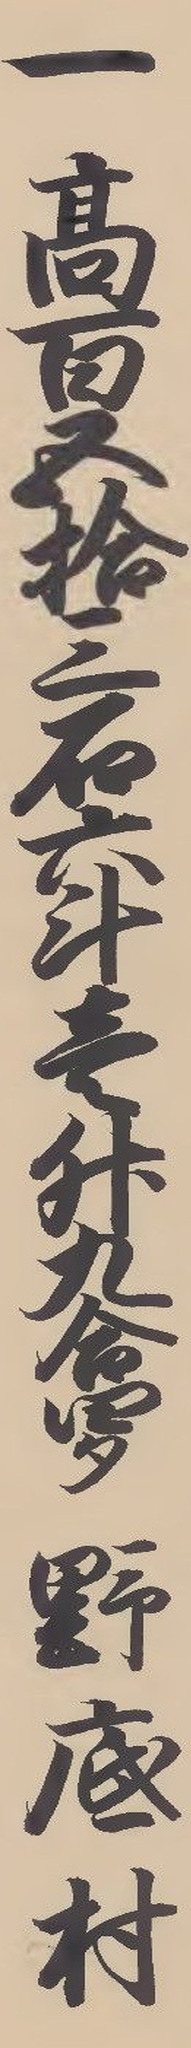一高百五拾三石六斗壱升九合四勺野底村
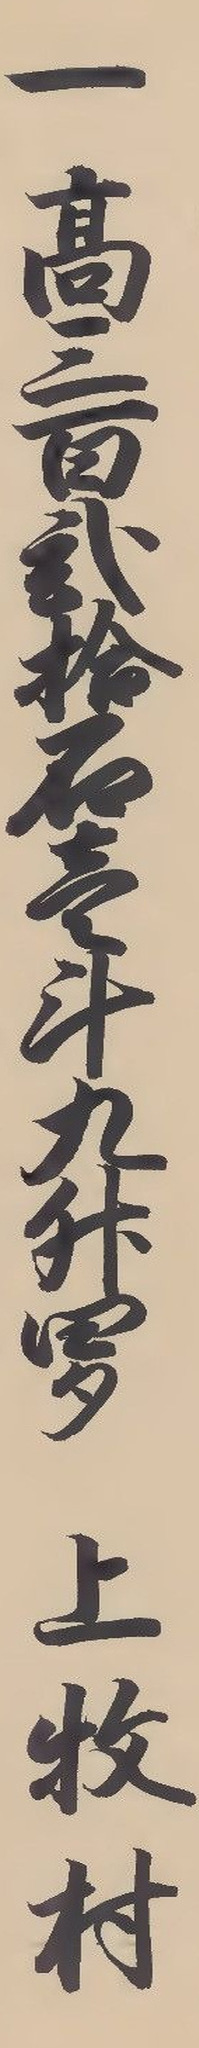一高三百弐拾石壱斗九升四勺上枚村
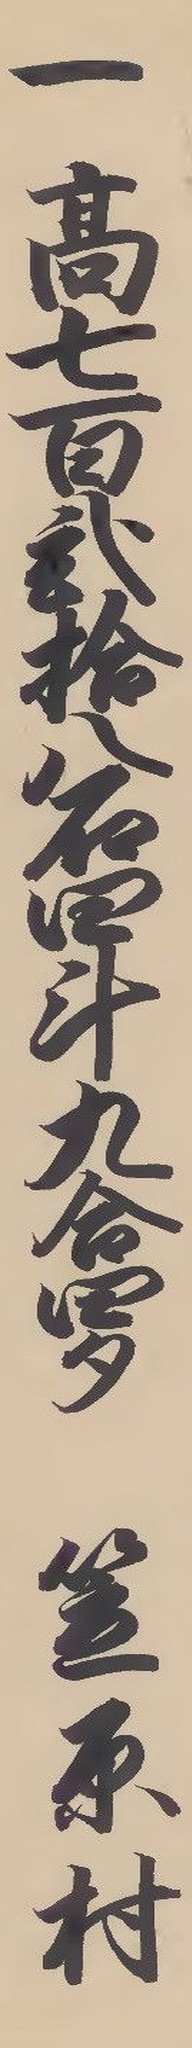一高七百弐拾八名四斗九合四勺笠原村

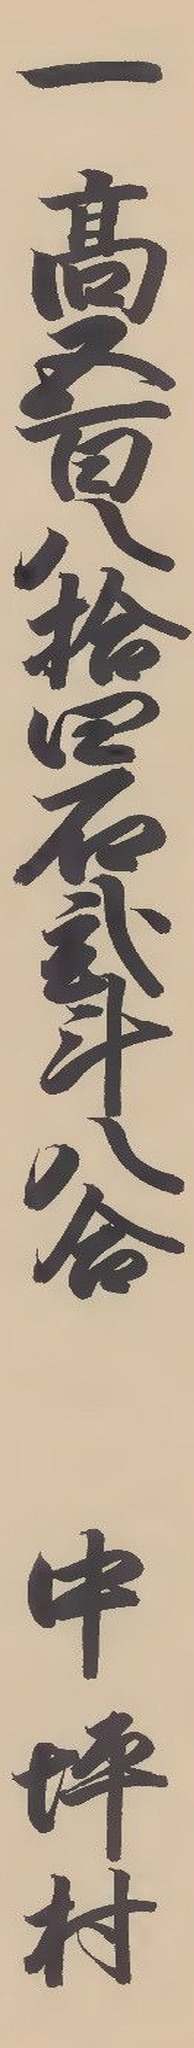一高五百八拾四石弐斗八合中坪村
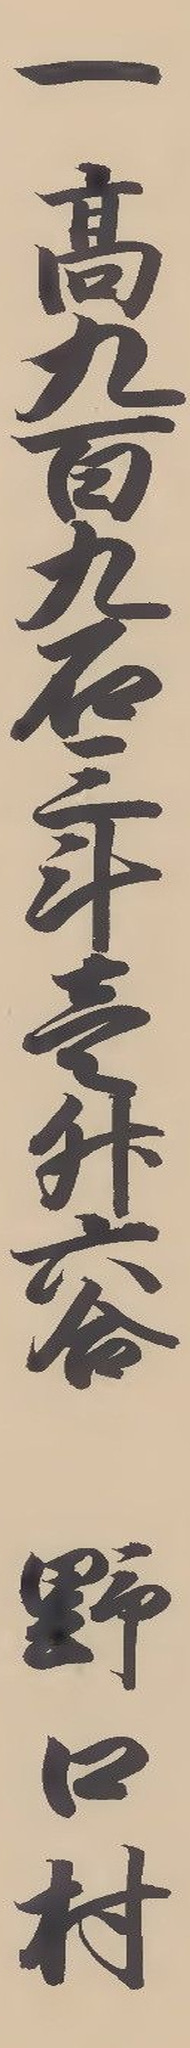一高九百九石三斗壱升六合野口村
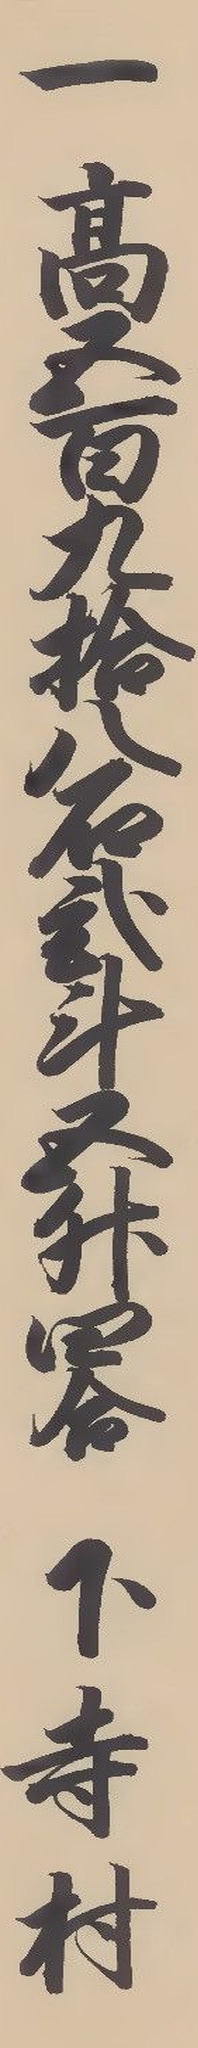一高五百九拾八石弐斗五升四合下寺村
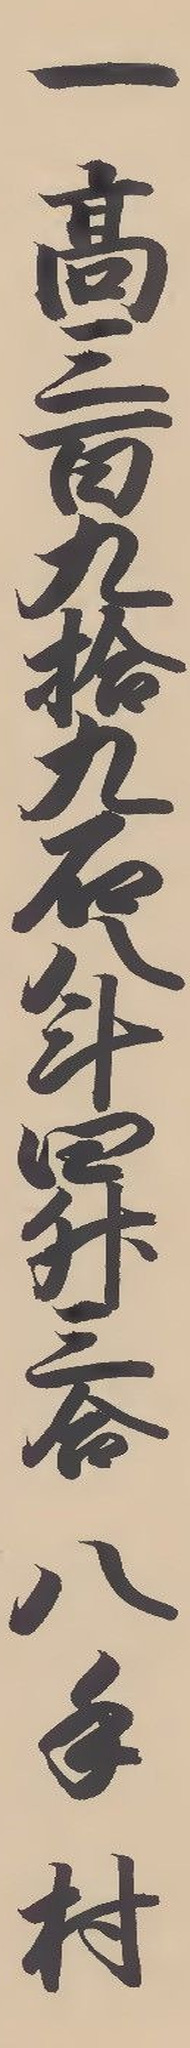一高三百九拾九石八斗四升三合八手村
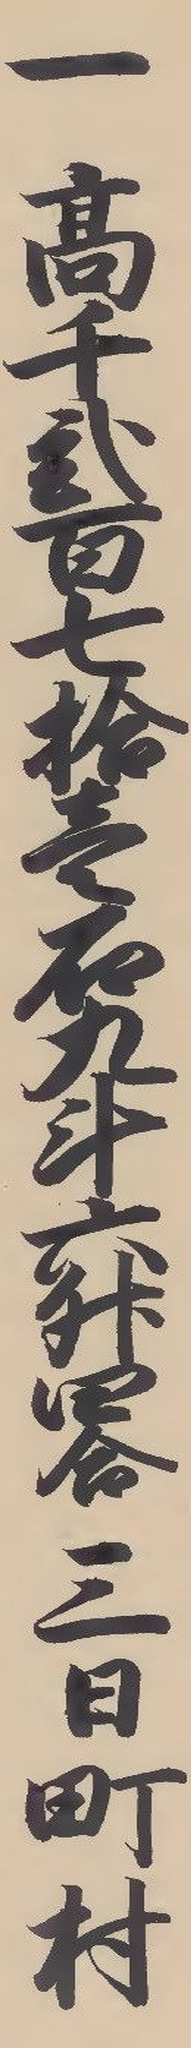一高千弐百七拾壱石九斗六升四合三日町村
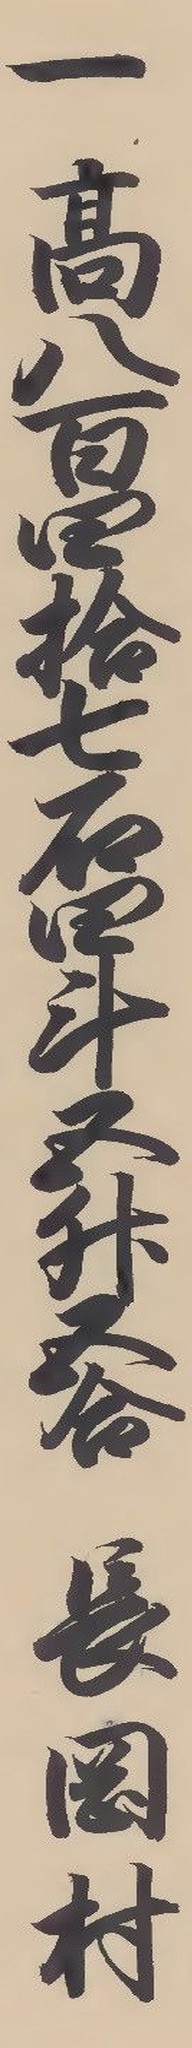一高八百四拾七石四斗五升五合長岡村
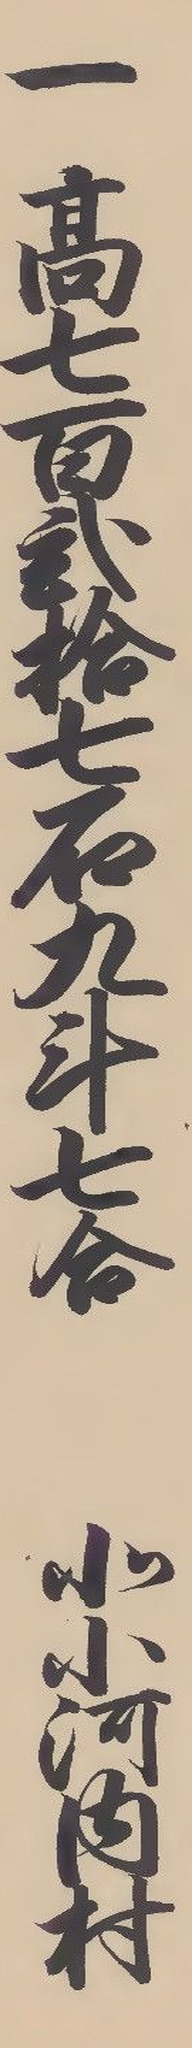一高七百弐拾七石九斗七合北小河内村
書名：信濃国郷帳
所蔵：国立公文書館 National Archives of Japan
